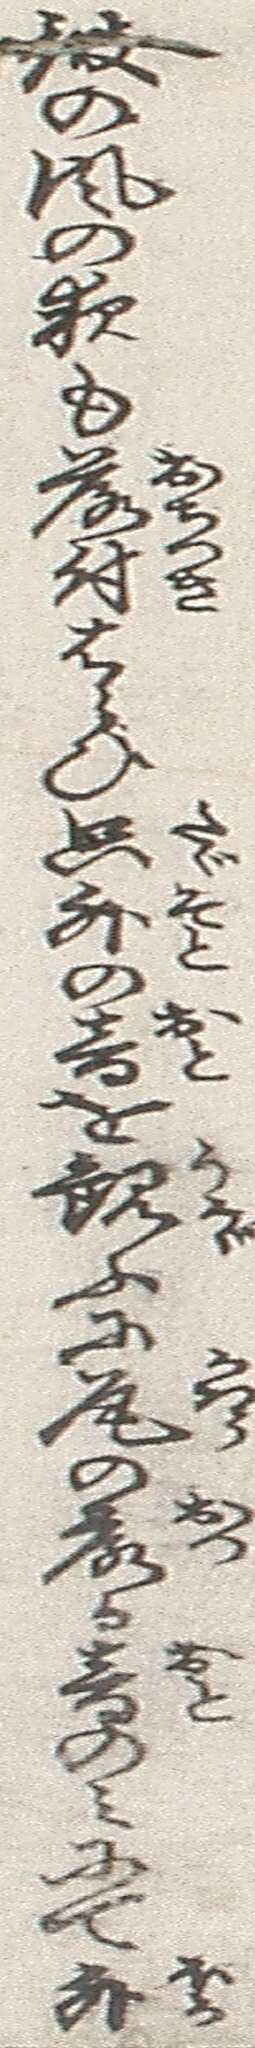彼の風の夜も落着はらひ只外の音を観ふに瓦の落る音のミにて外
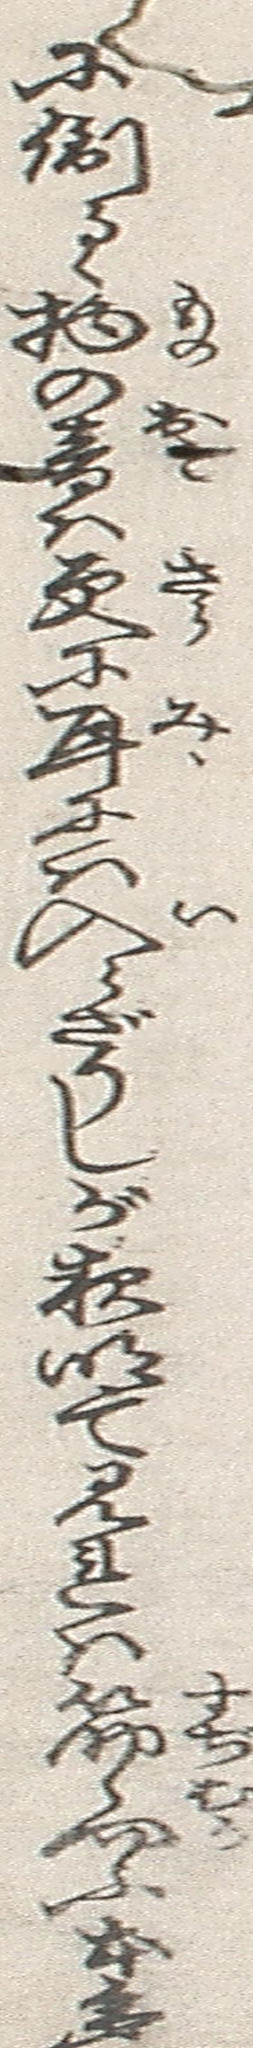に倒るゝ物の音は更に耳にハ入らざりしが夜明て見れハ筋向ふ本多
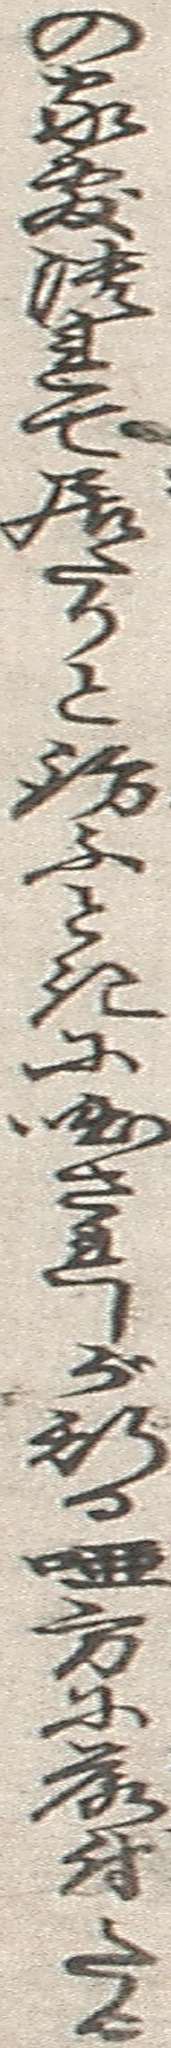の屋敷潰れて居たりと訪ふときに咄されしが斯る唖方に落着たる

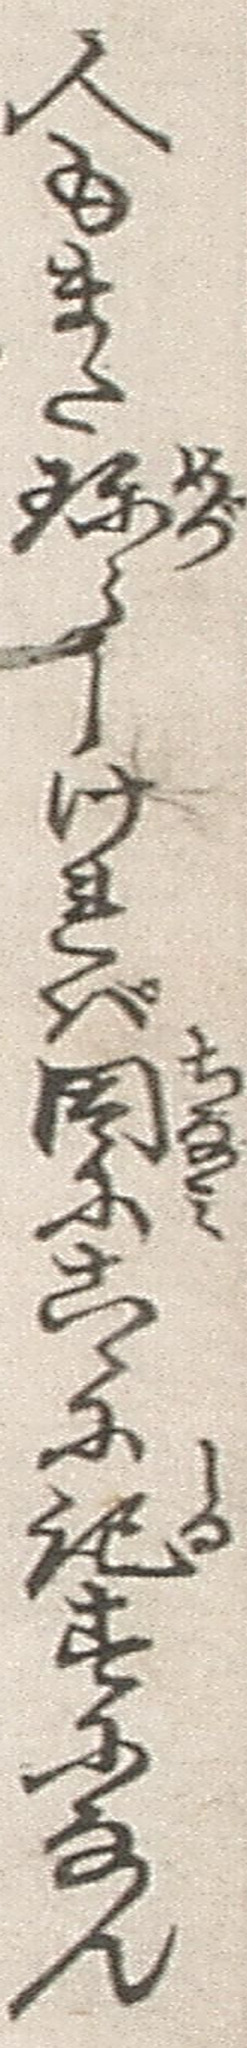人もまた珍しけれバ因にこゝに紀すになん
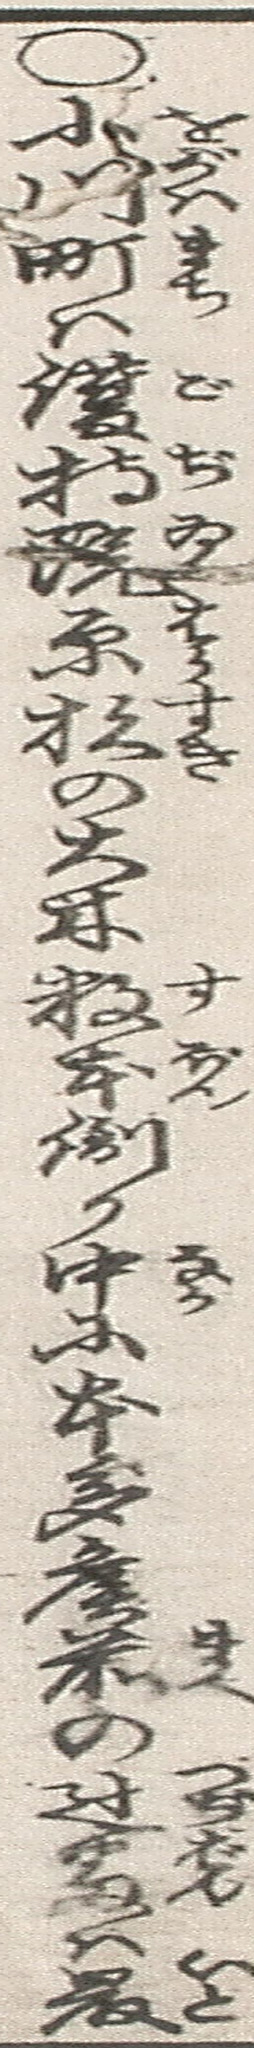◯小川町ハ護持院原杉の大木数本倒り中に本多矦前の辻番ハ最
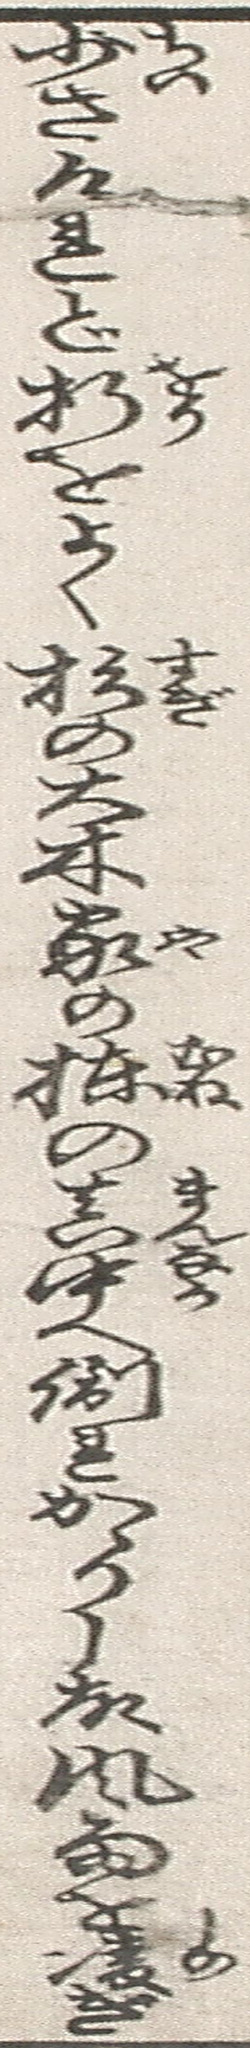少さけれど折をよく杉の大木家の棟の真中へ倒れかゝりし故風雨を凌ぎ
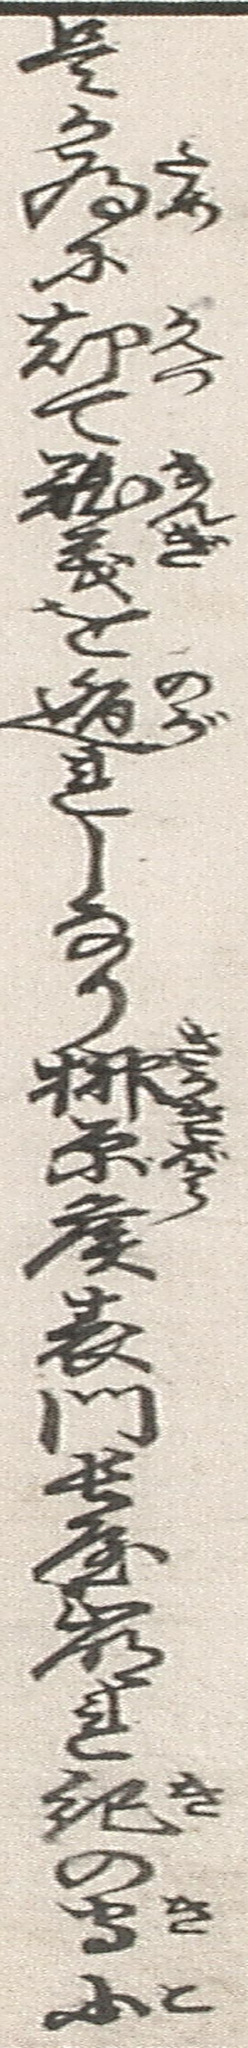是が為に却て難義を遁れしなり榊原矦表門長屋崩れ紀の守小
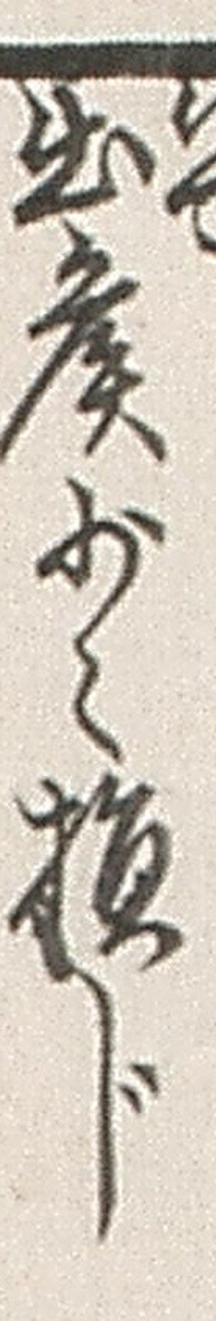出矦少々損じ
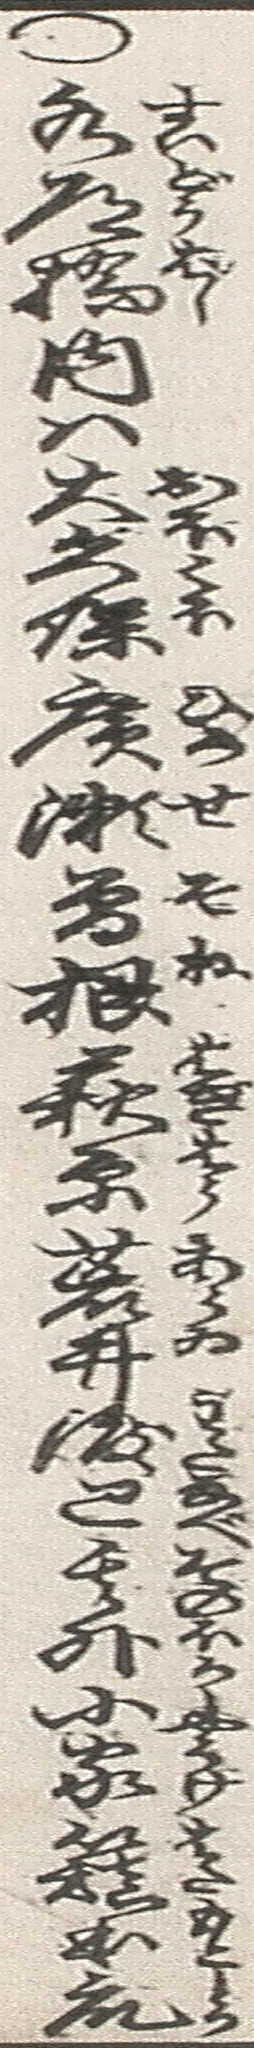◯水道橋内ハ大久保広瀬曽根萩原荒井渡邊其外小家簱本衆
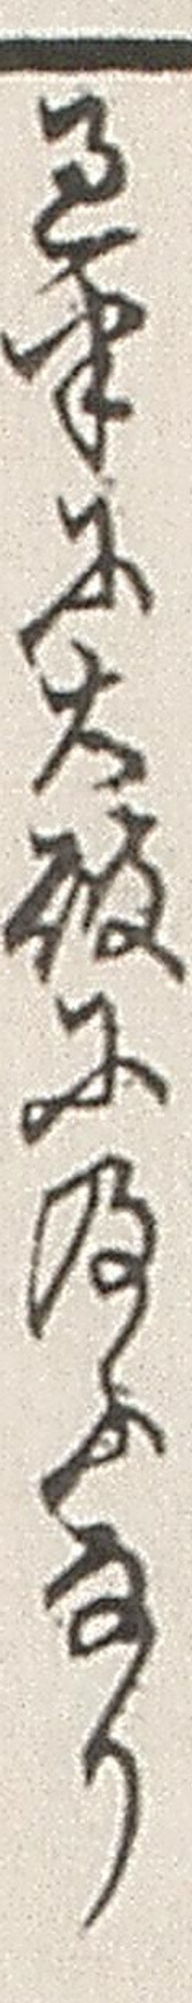過半に大破に及ふなり
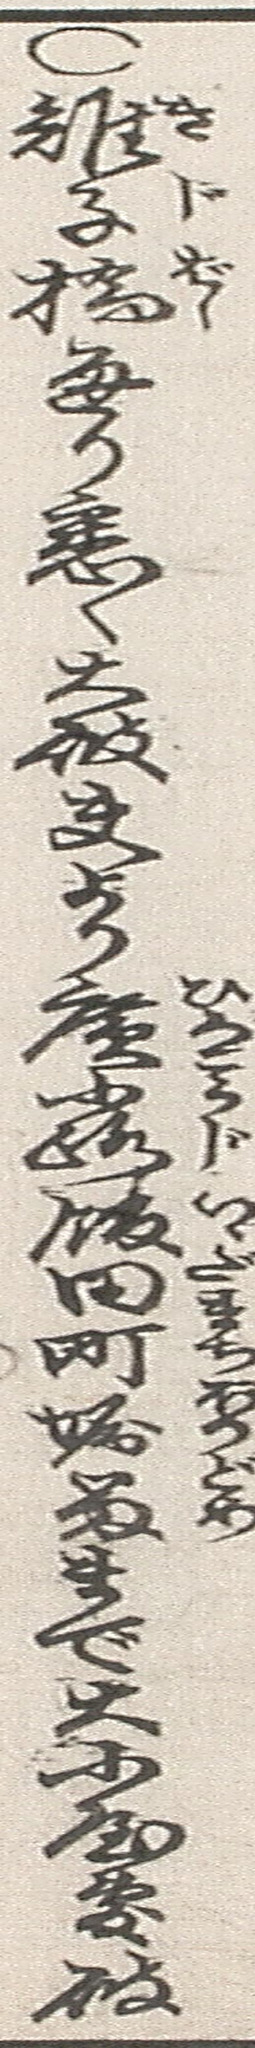◯雉子橋通り悉く大破夫より広小路飯田町堀留まで大小屋敷破
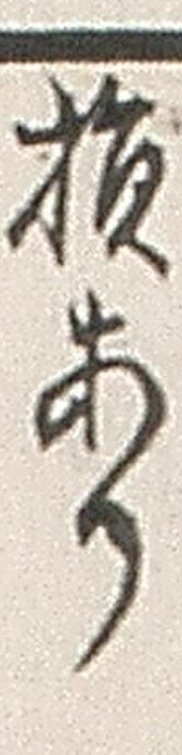損あり
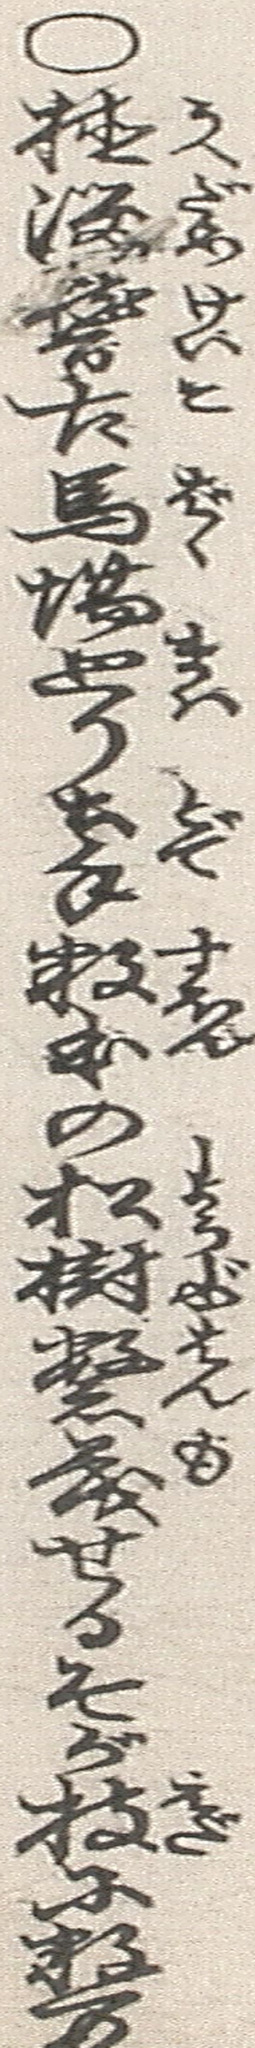◯植溜稽携古馬場廻り土手数本の松樹繁茂せるそが枝に数万
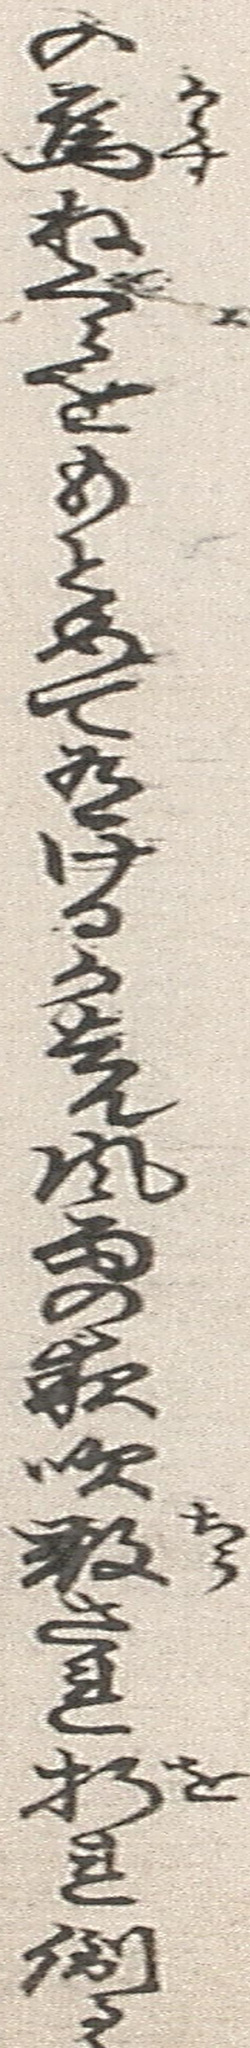の烏ねくらをもとめて有ける去ㇽ風雨の夜吹散され折れ倒るゝ
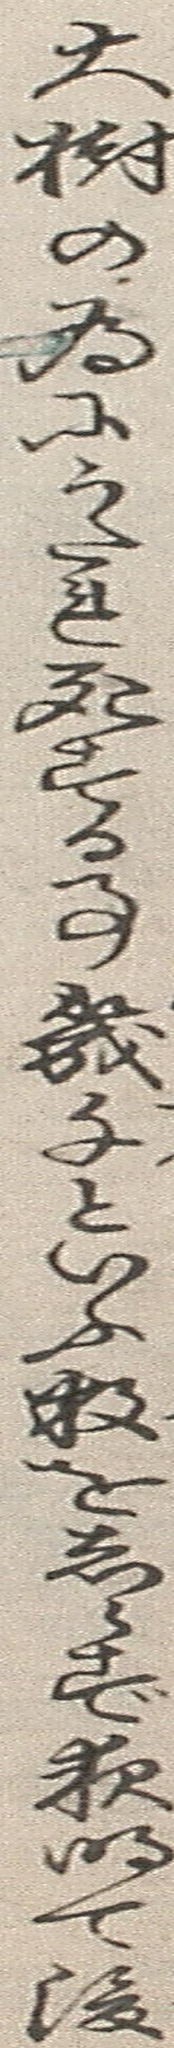大樹の為にうたれ死する事幾千といふ数をしらず夜明て後
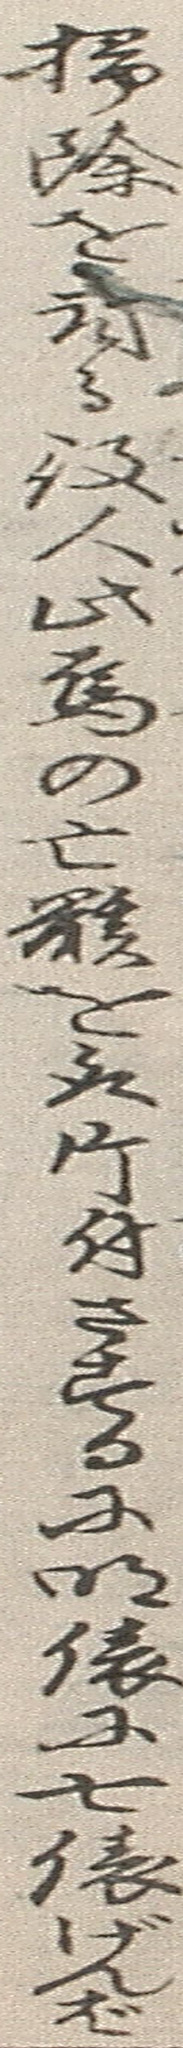掃除を司る役人此烏の亡骸を取片付さするに明俵に七俵げんば
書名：安政風聞集　上中下　全
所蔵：東京大学地震研究所図書室 Earthquake Research Institute Library, The University of Tokyo, JAPAN
